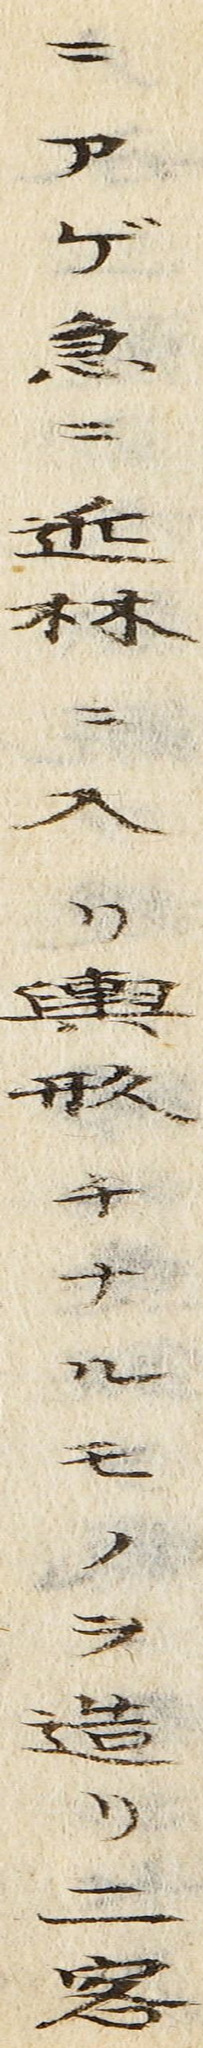ニアゲ急ニ近林ニ入リ輿形チナルモノヲ造リ二客
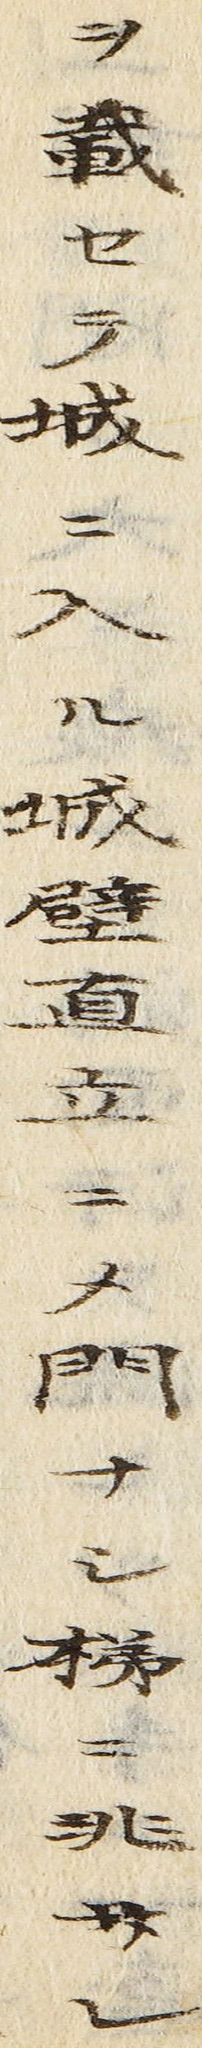ヲ載セテ城ニ入ル城壁直立ニシテ門ナシ梯ニ非サレ
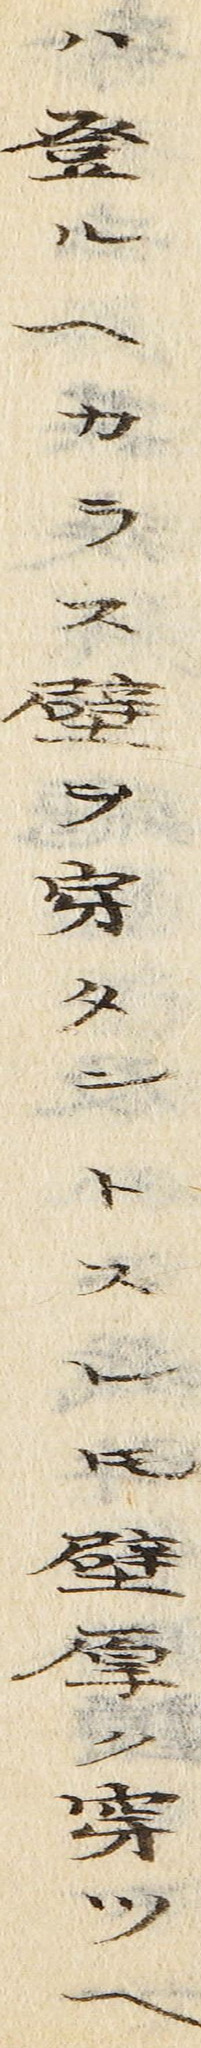ハ登ルヘカラス壁ヲ穿タントスレトモ壁厚ク穿ツへ
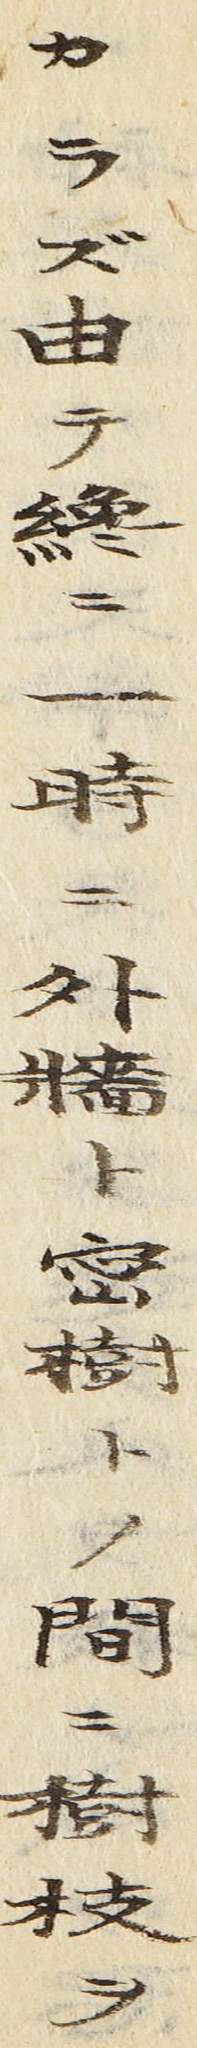カラズ由テ纔ニ一時ニ外牆ト密樹トノ間ニ樹枝ヲ
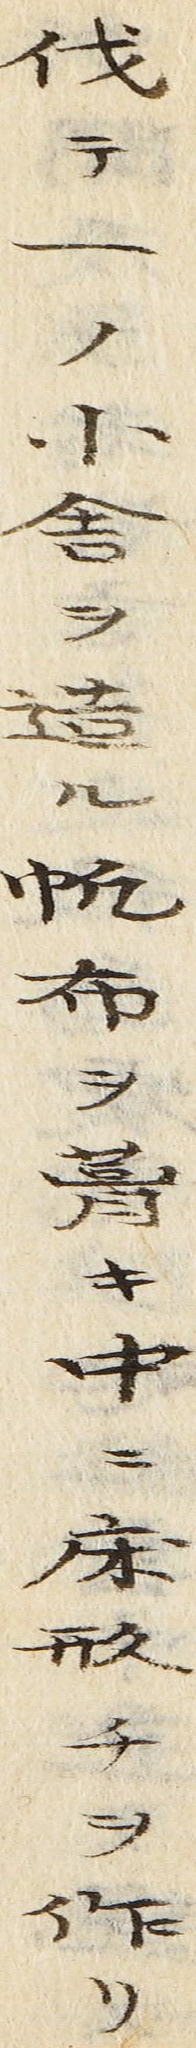伐テ一ノ小舎ヲ造ル帆布ヲ葺キ中ニ床形チヲ作リ
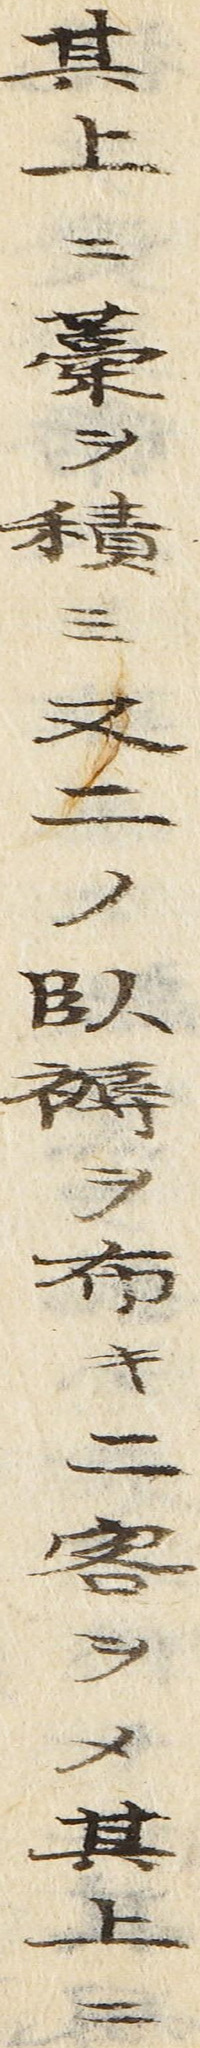其上ニ藁ヲ積ミ又二ノ臥褥ヲ布キ二客ヲシテ其上ニ
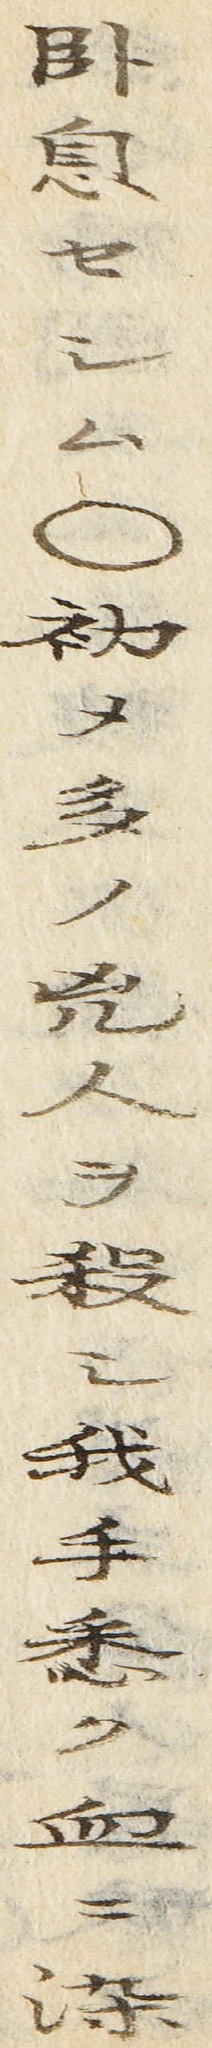臥息セシム◯初メ多ノ兇人ヲ殺シ我手悉ク血ニ染
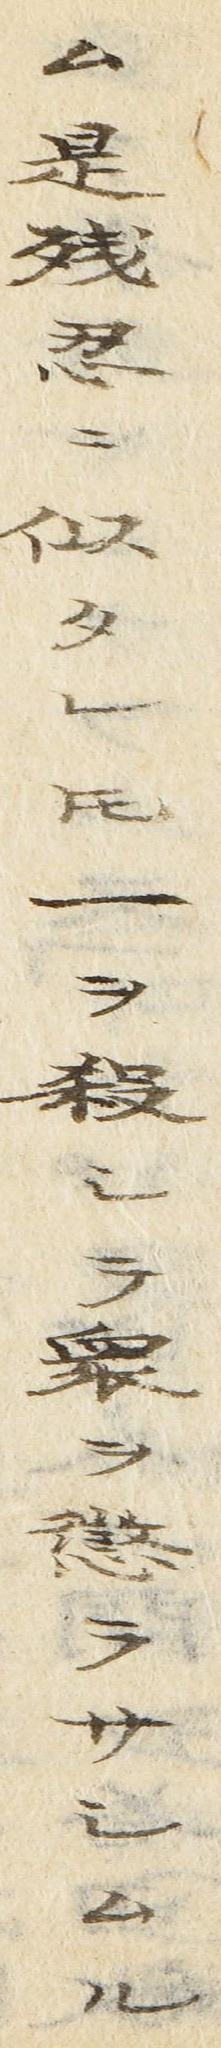ム是残忍ニ似タレトモ一ヲ殺シテ衆ヲ懲ラサシムル
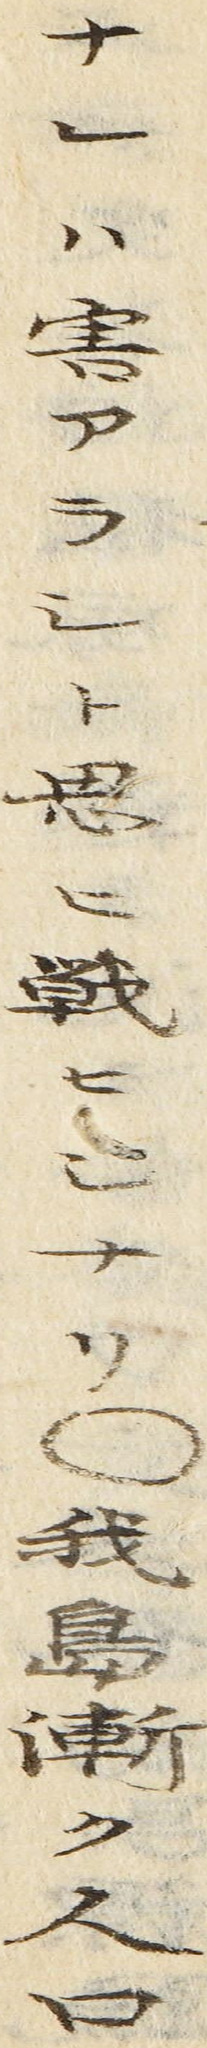ナレハ害アラシト思ヒ戦ヒシナリ◯我島漸ク人口
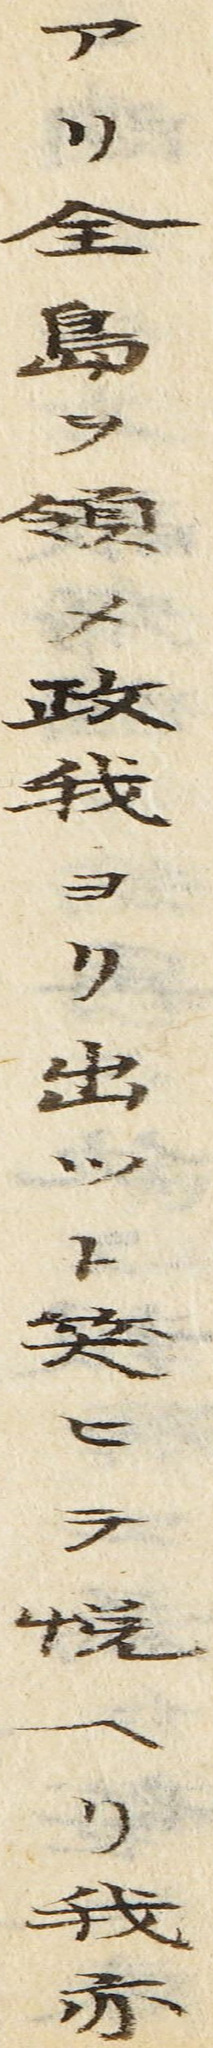アリ全島ヲ領メ政我ヨリ出ツト笑ヒテ悦ヘリ我亦
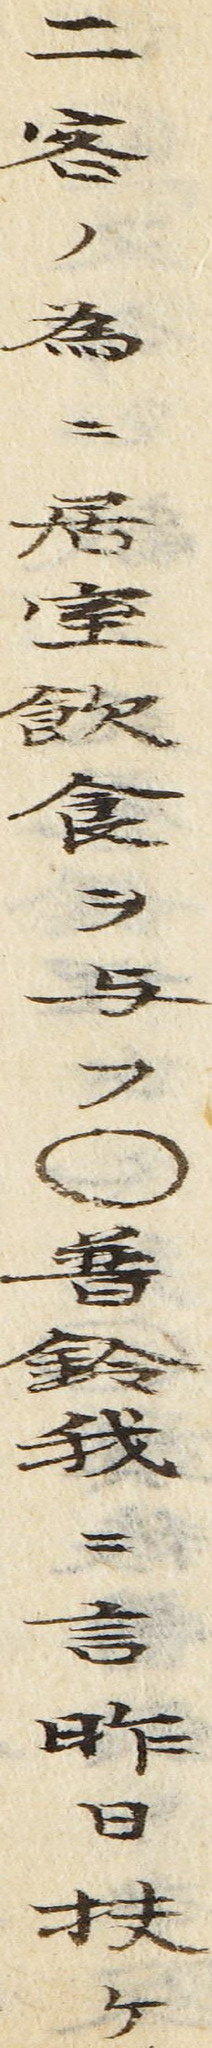二客ノ為ニ居室飲食ヲ与フ◯普鈴我ニ言昨日扶ケ
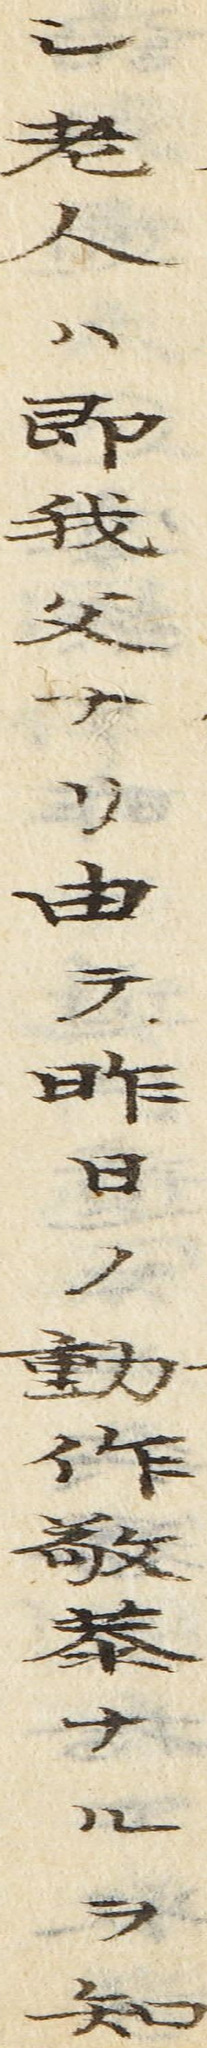シ老人ハ即我父ナリ由テ昨日ノ動作敬恭ナルヲ知
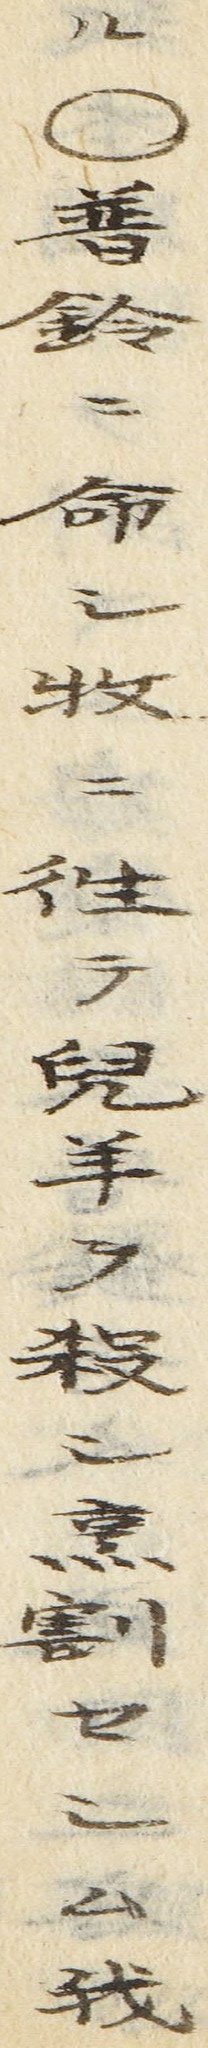ル◯普鈴ニ命シ牧ニ往テ児羊ヲ殺シ烹割セシム我
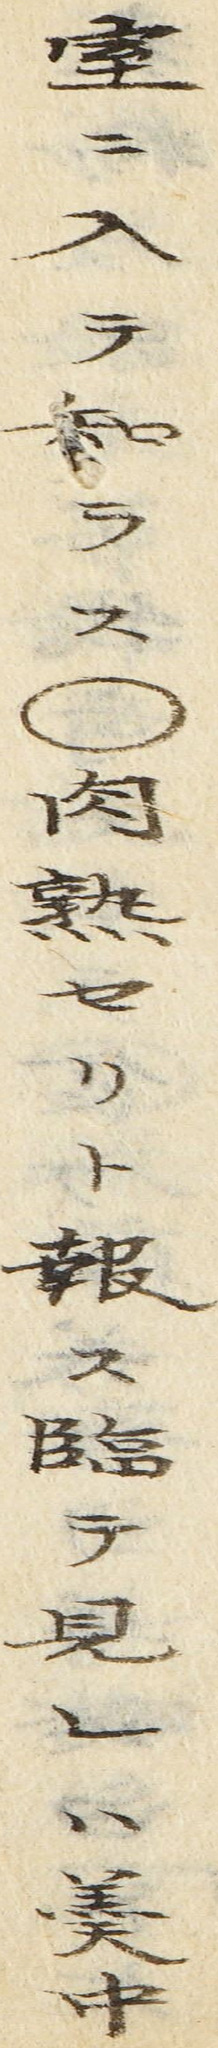室ニ入テ知ラス◯肉熟セリト報ス臨テ見レハ羹中

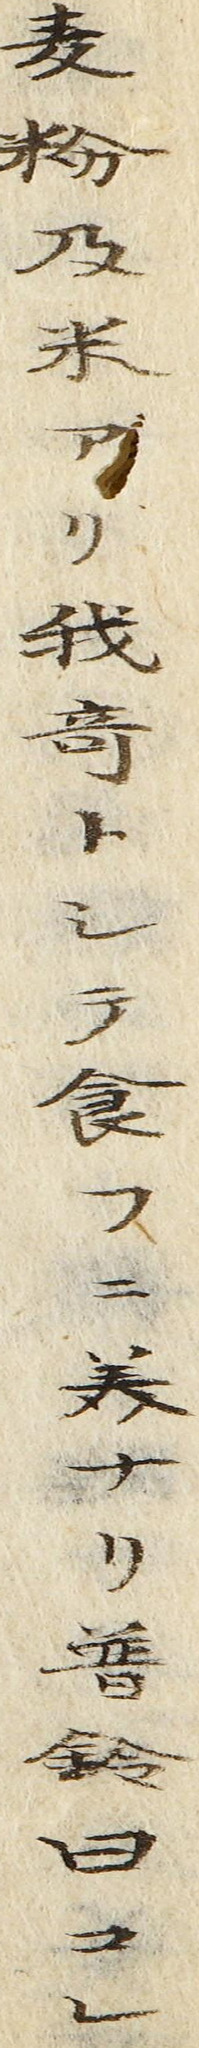麦粉及米アリ我奇トシテ食フニ美ナリ普鈴曰コレ
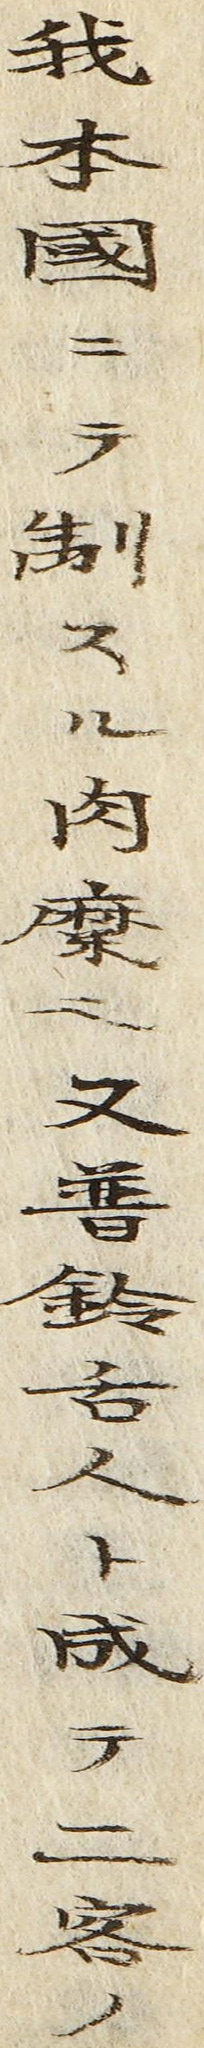我本国ニテ制スル肉糜也又普鈴舌人ト成テ二客ノ
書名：漂流紀事
